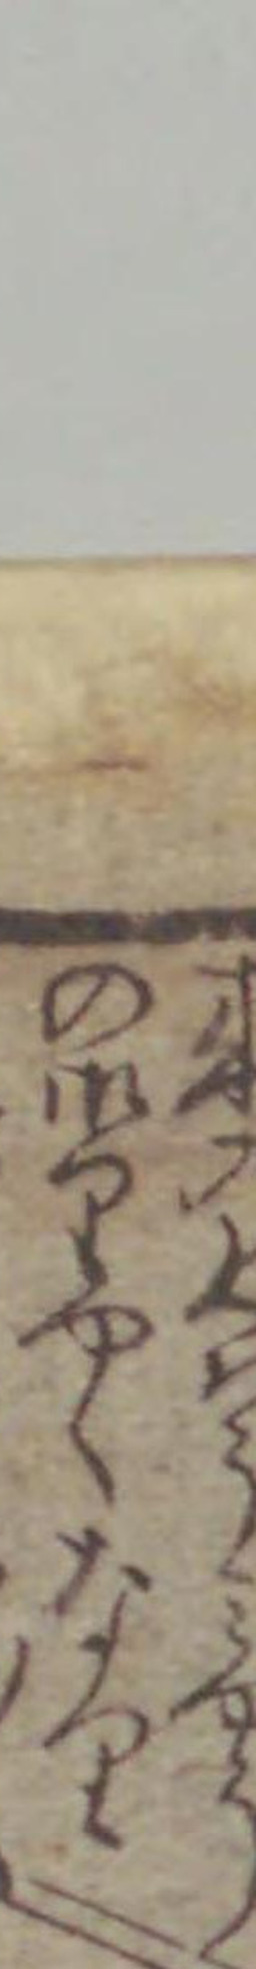の御りやくなり
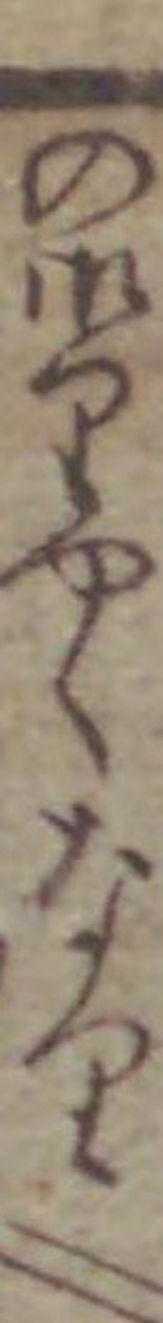の御りやくなり
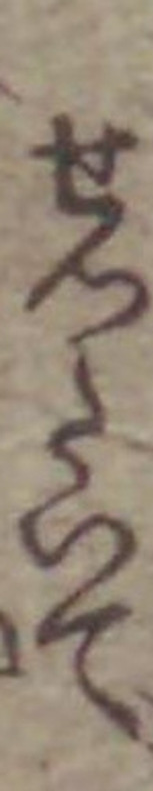せつたいて
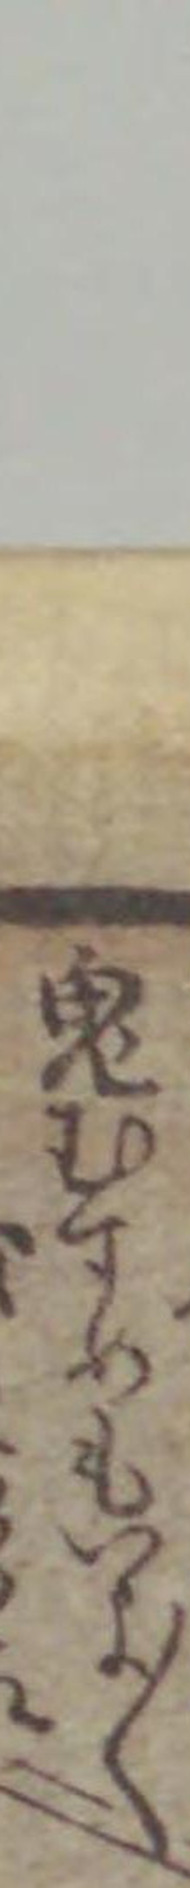鬼むすめもいよ〳〵
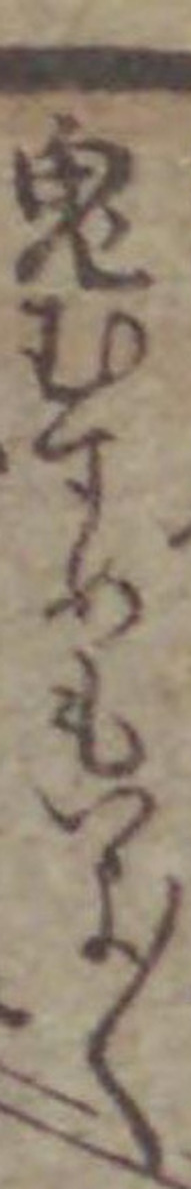鬼むすめもいよ〳〵
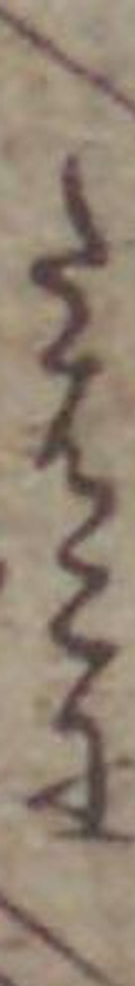たはこに
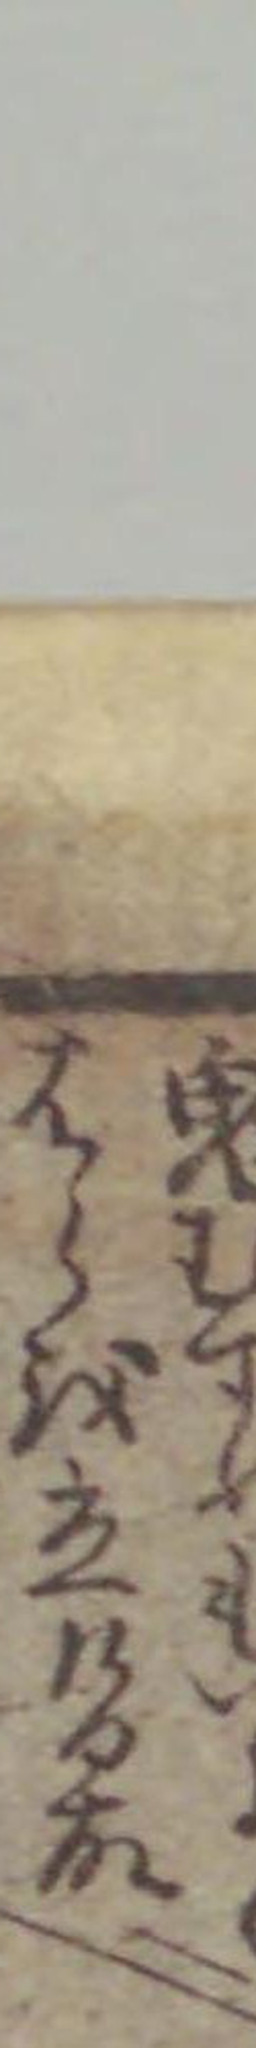はらを立ける故
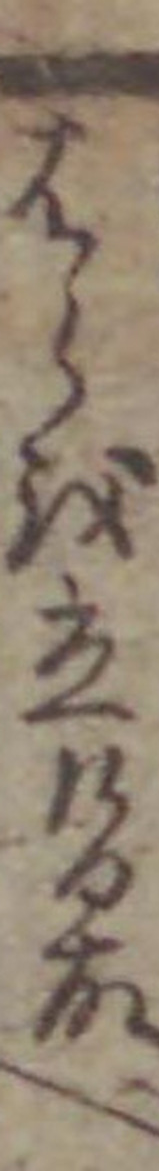はらを立ける故
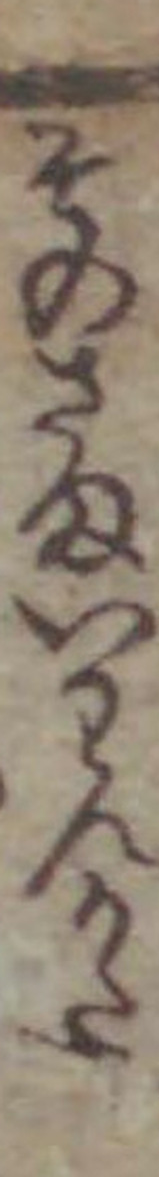そのさまいわんかた
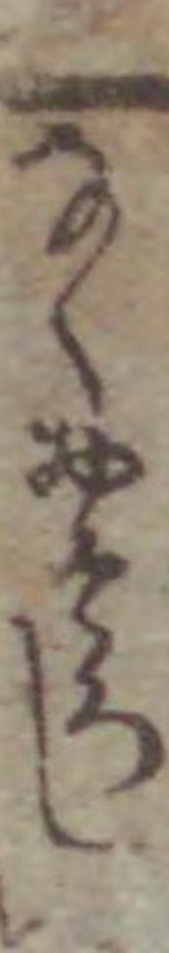なくおそろし
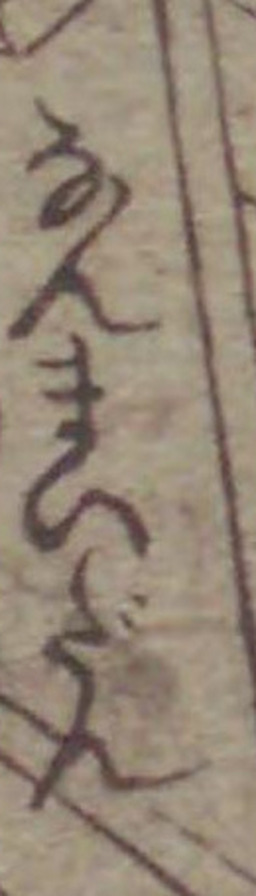なんまいだん

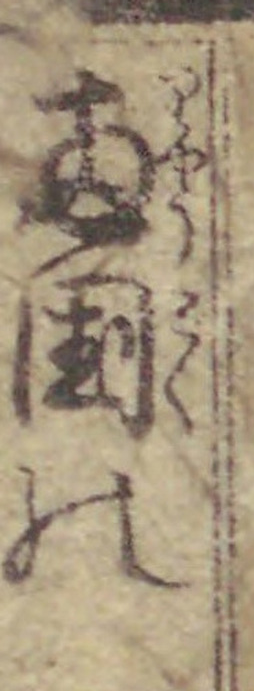両国の
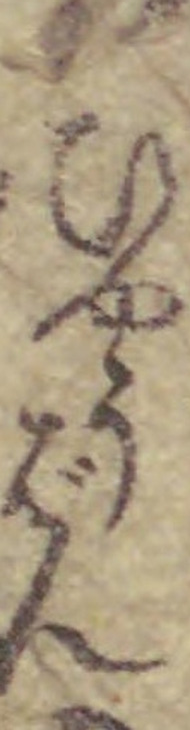ひやうばん
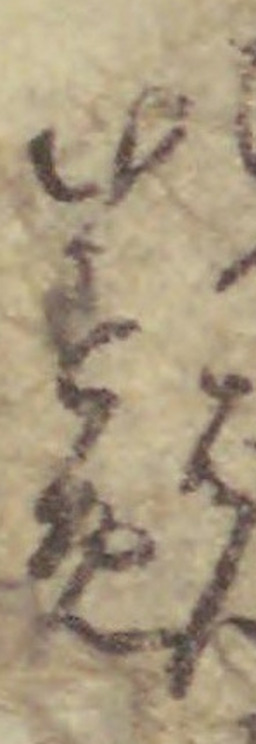むすめ

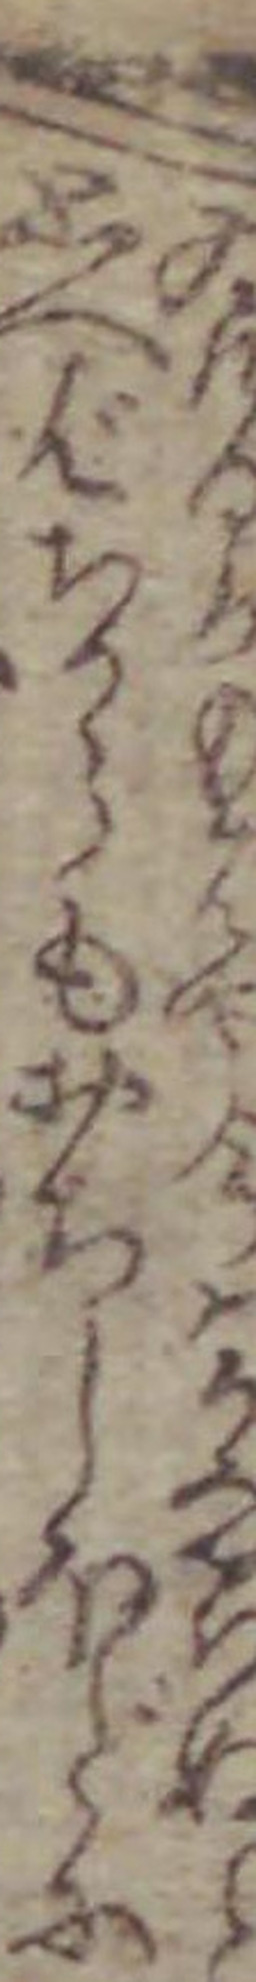思へばちからもおちしほどに
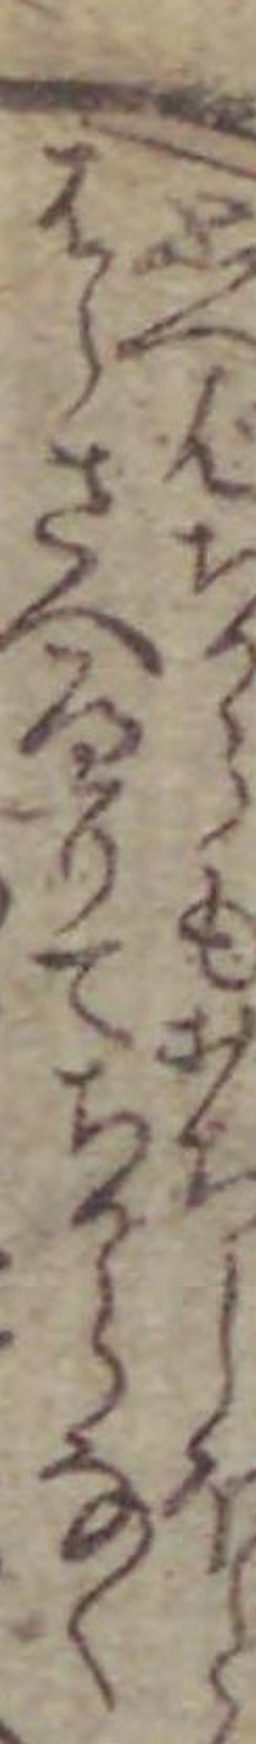はらさへへりてちからなく
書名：鬼の趣向草 2巻
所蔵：国立国会図書館 National Diet Library, JAPAN
